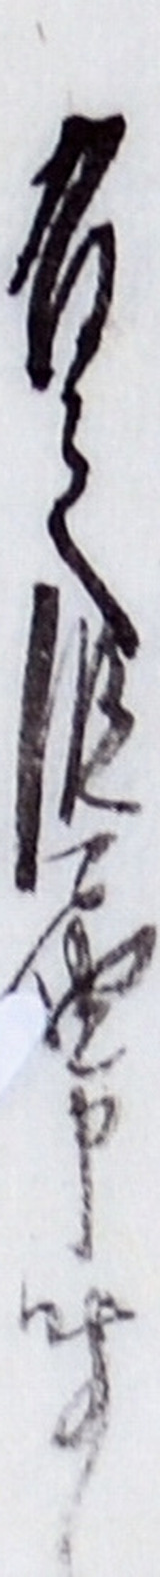有之段届申聞候
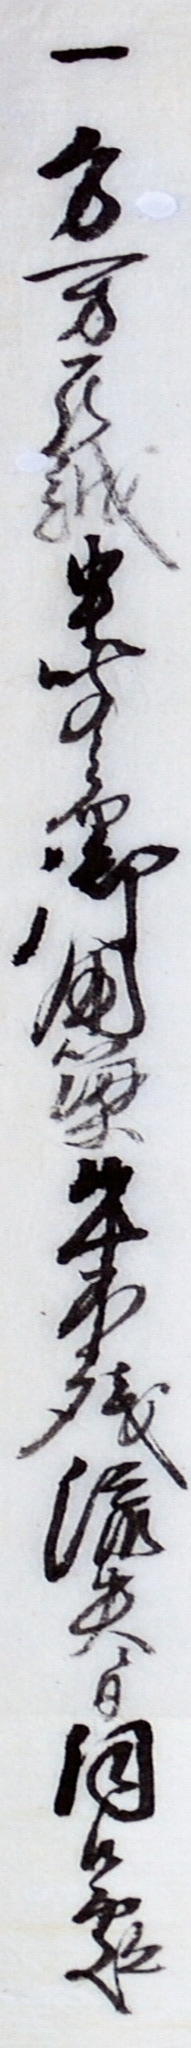一方一方罷越申聞ニ付御用簗牛不残流失ニ付伺候処
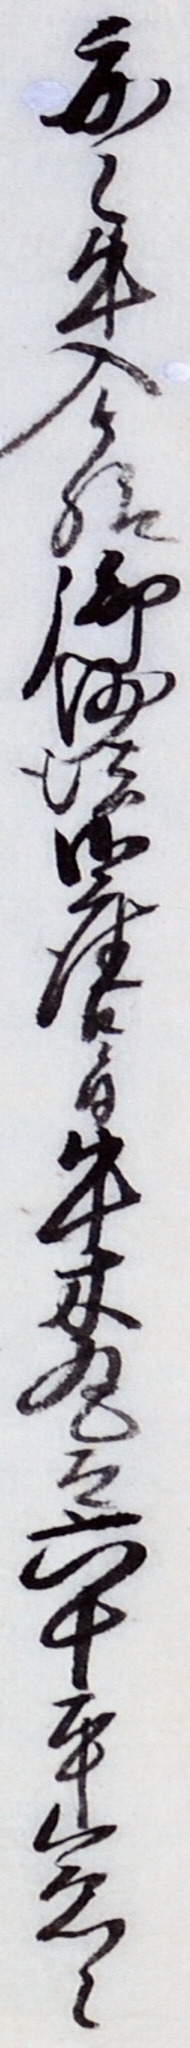亦々牛入候様御沙汰御座候ニ付牛木丸太六十本急之
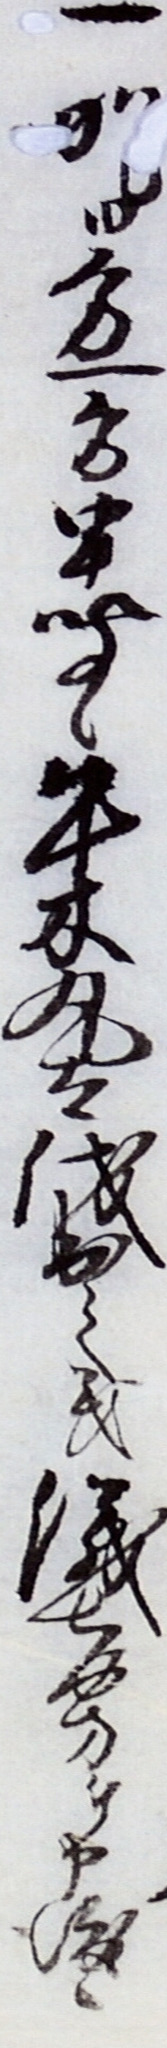一昨日方一方申聞候牛木丸太伐出之義儀左衛門方江申渡候
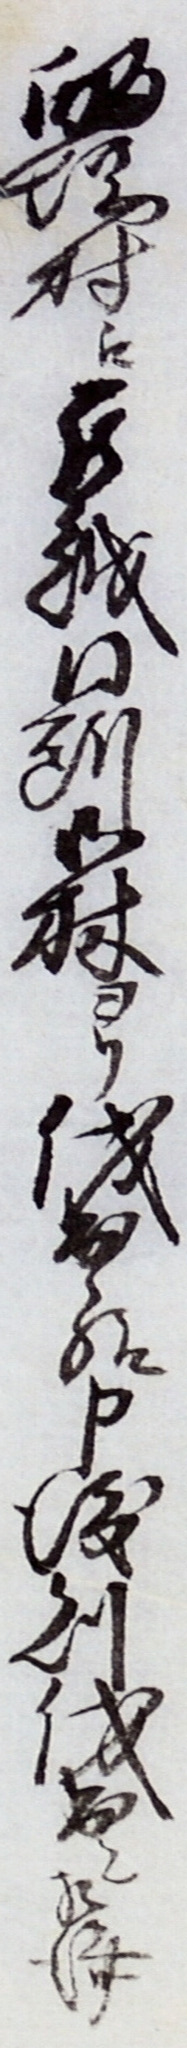的場村江罷越同断御林ヨリ伐出候様申渡則伐出シ被仰済
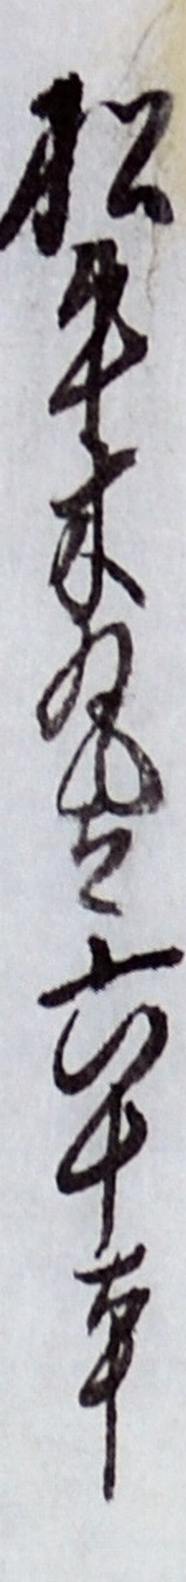松牛木丸太六十本
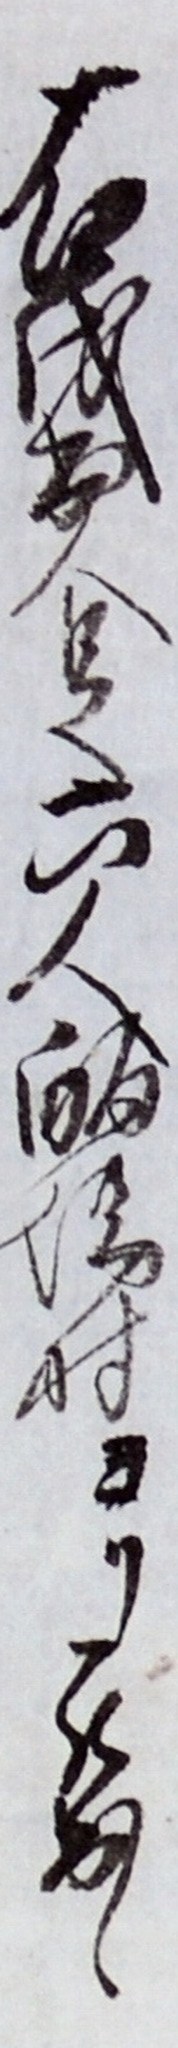右伐出人足六人的場村ヨリ罷出候
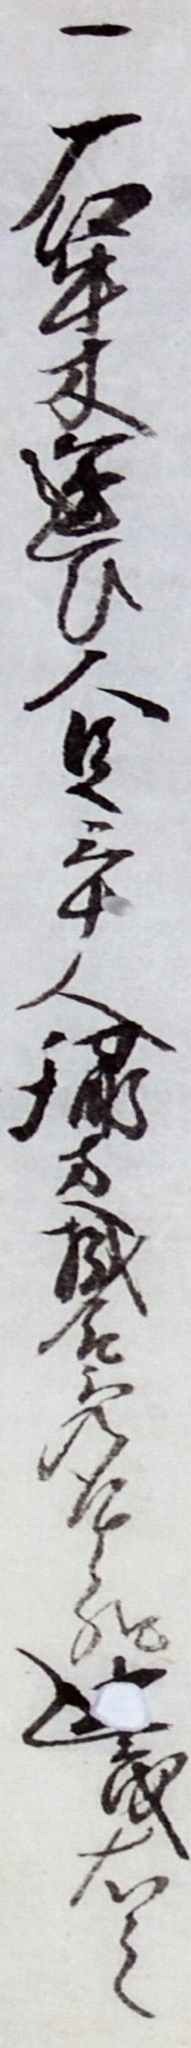一右牛木運ひ人足三十人郷方へ掛合受取候様迚も右之

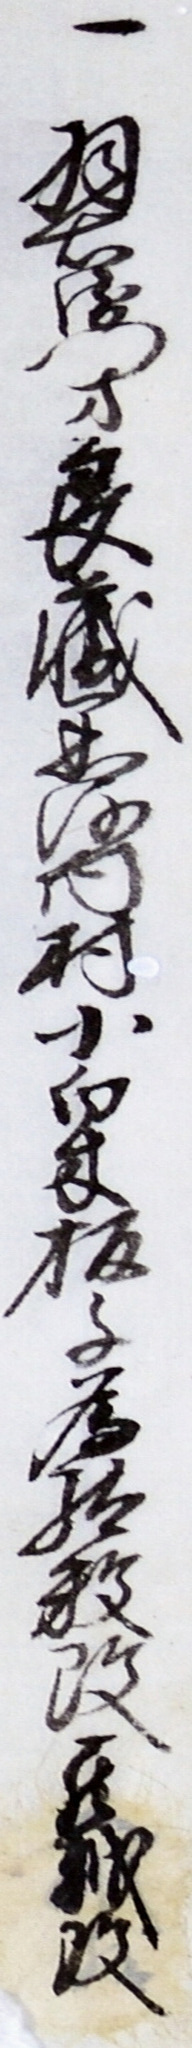一羽右衛門方良蔵黒河内村小白木板子為駄数改罷越改
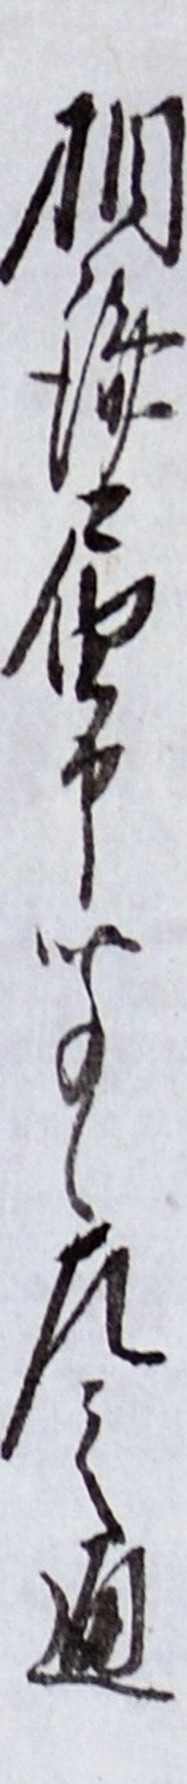相済届申聞候左之通
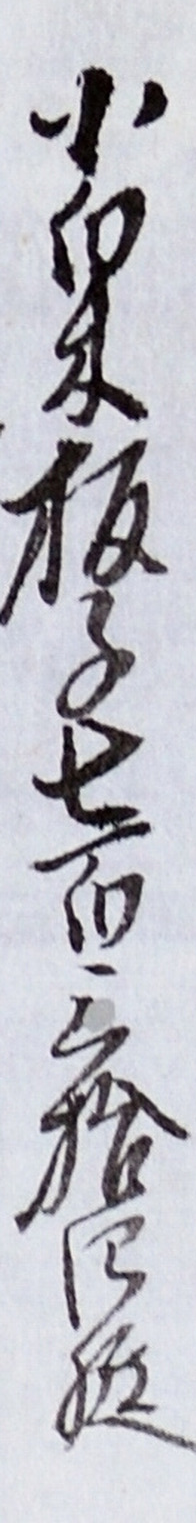小白木板子七百三拾四挺
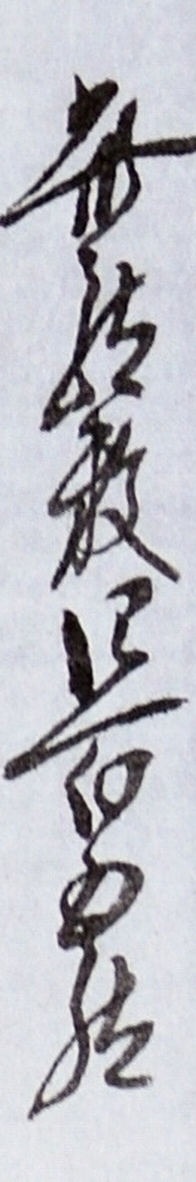此駄数四百五駄
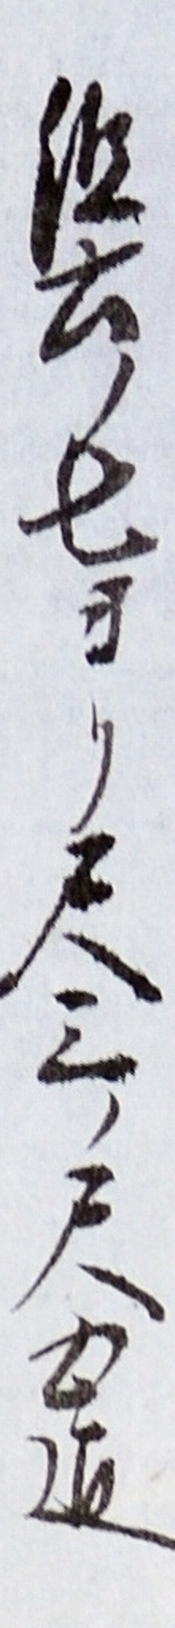但六ノ七ヨリ尺三ノ尺五迄
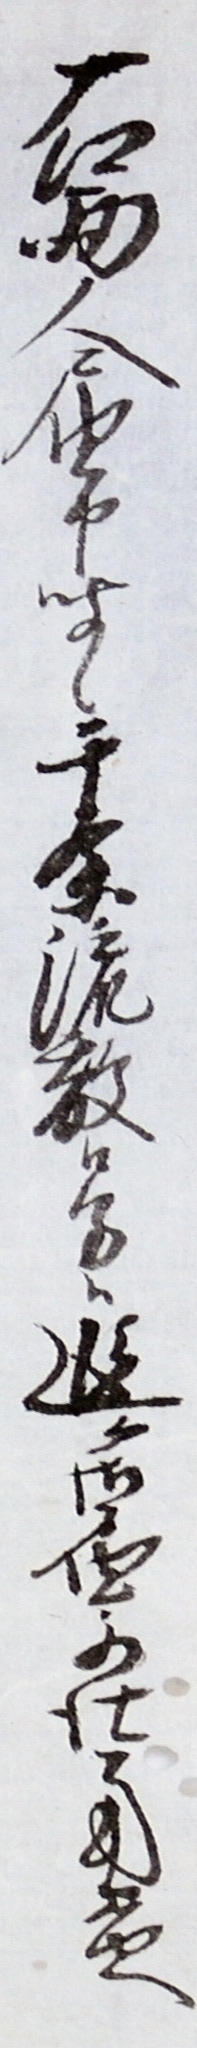右両人届申聞候于余流散候分は追而御届可仕御用番へ
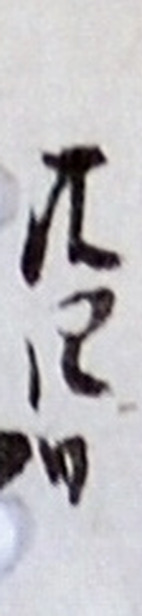廿四日
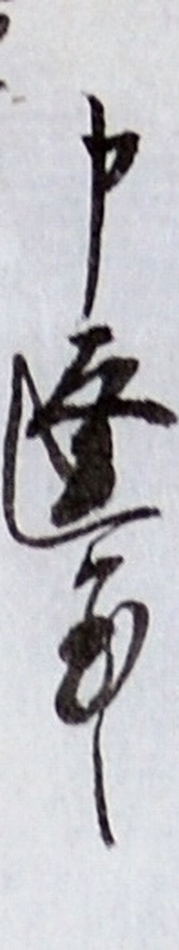申達置候
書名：御山奉行御用控
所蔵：伊那市立高遠町図書館・合同会社AMANE
